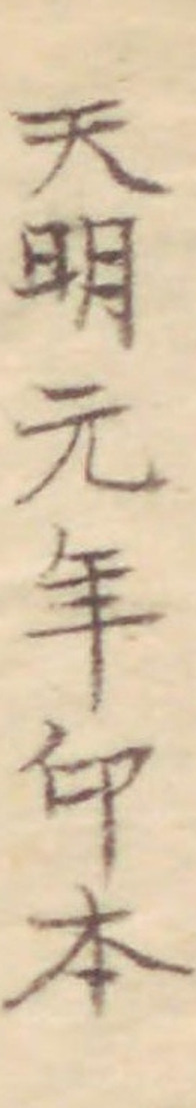天明元年印本
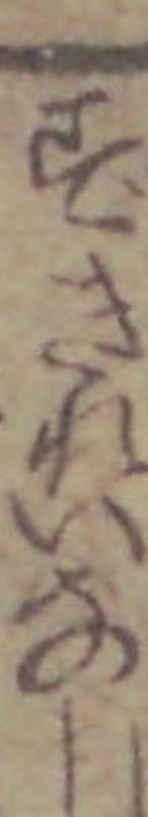ずきれいな
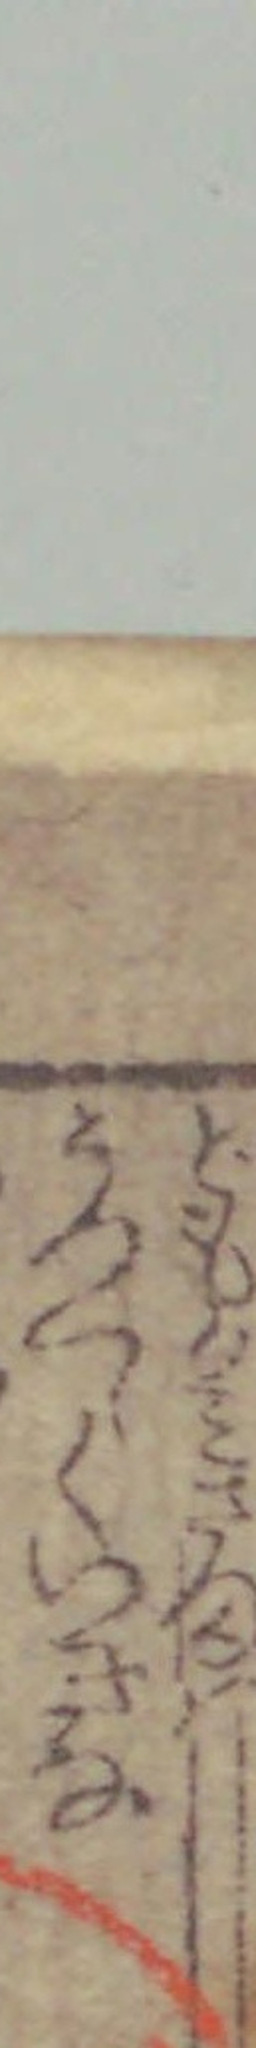うつくしくいきな
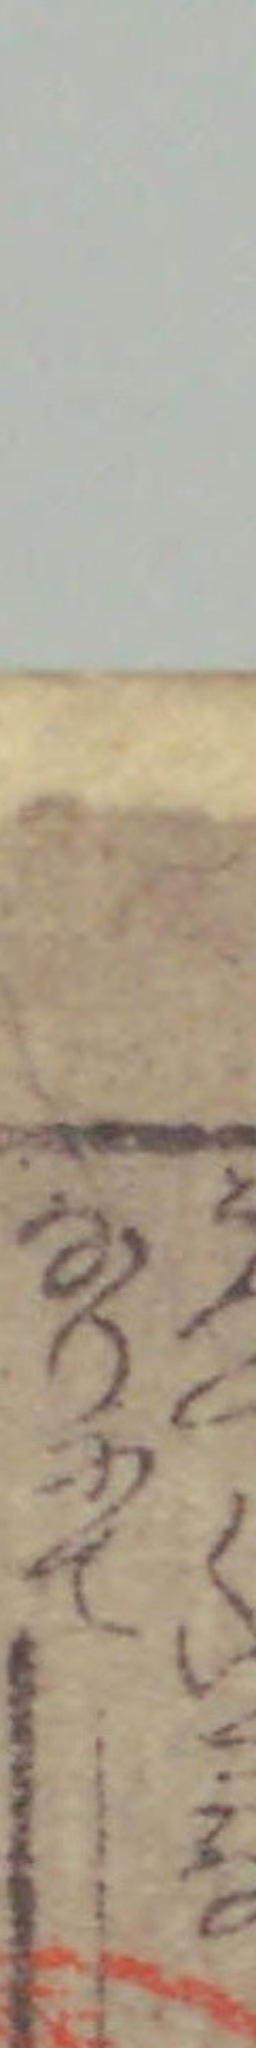なりにて
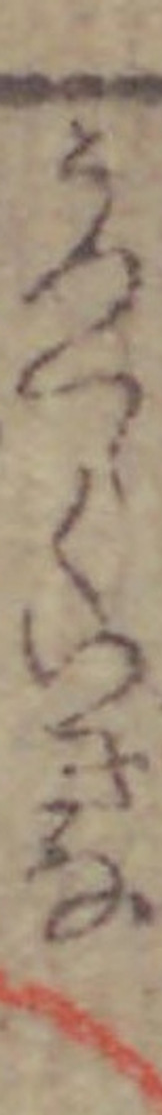うつくしくいきな
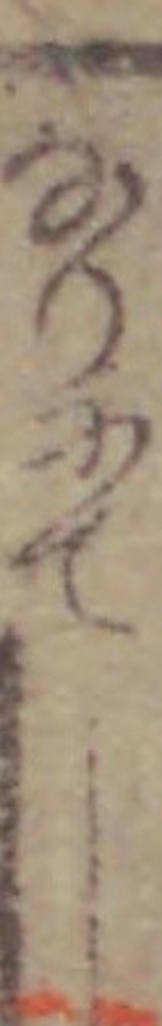なりにて
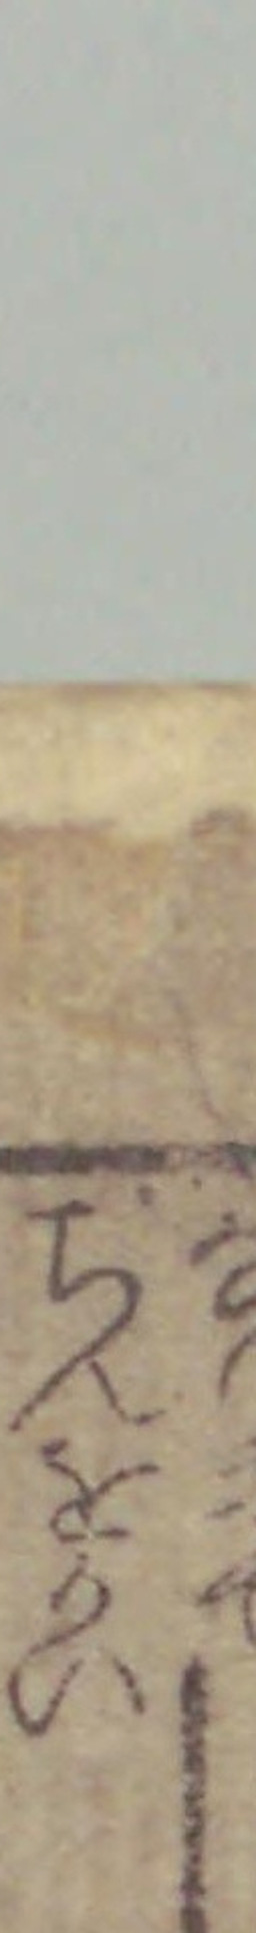ちんをかい
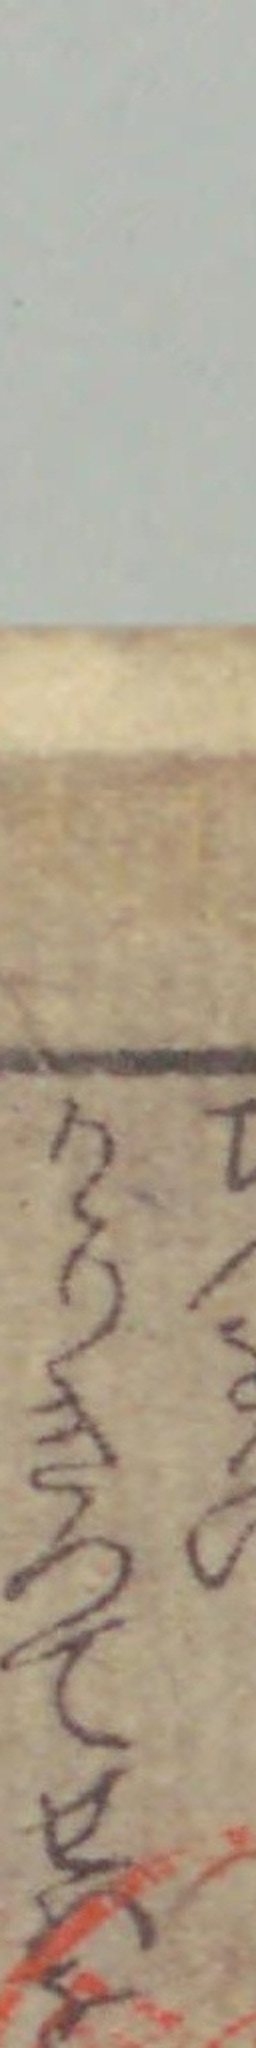かゝりきつてせはを
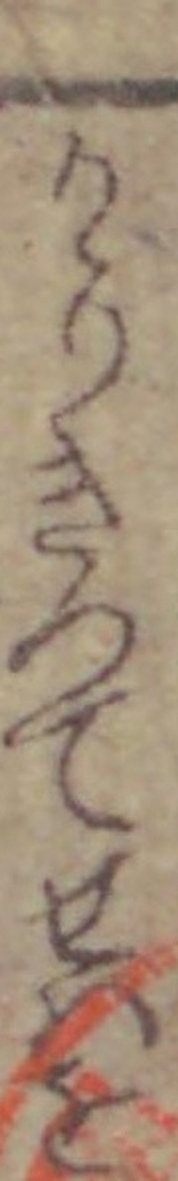かゝりきつてせはを
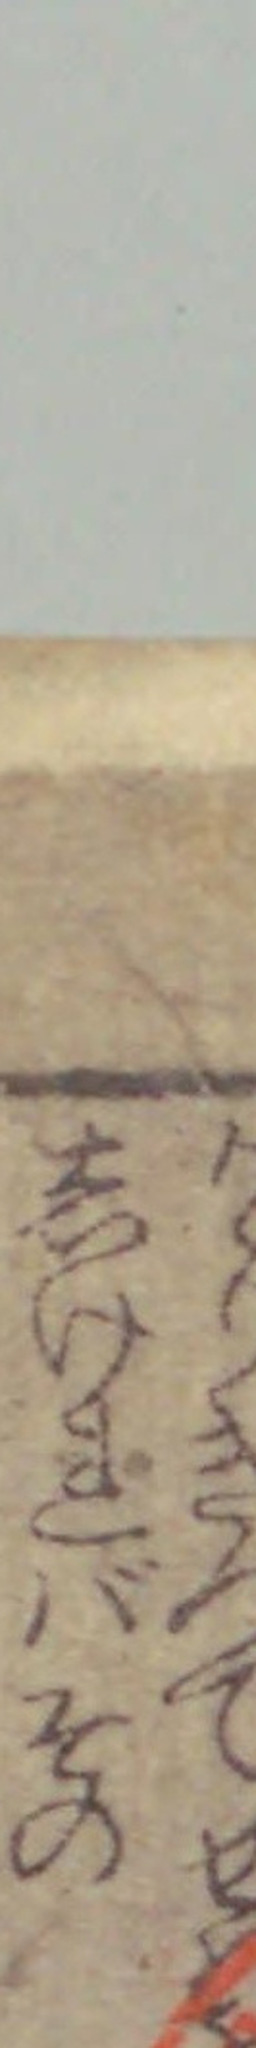しければその
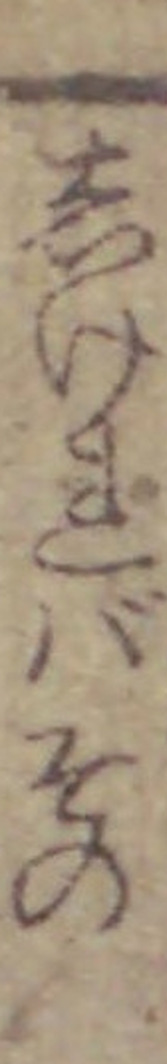しければその
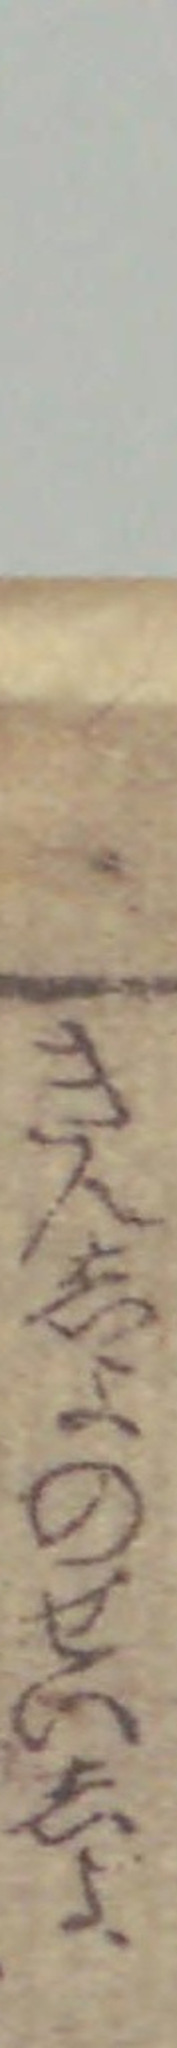きんしよのせはしよ
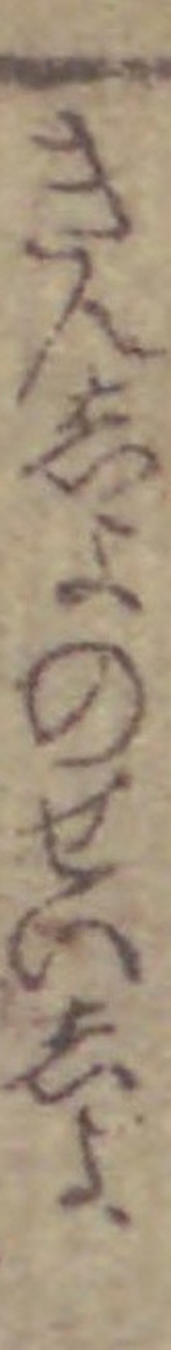きんしよのせはしよ
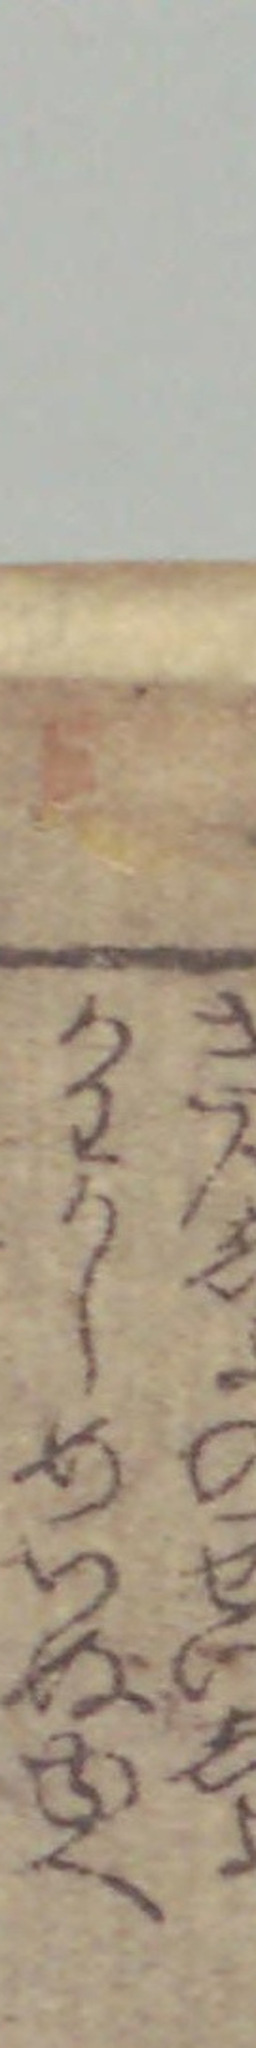かわかしめいぬゆへ
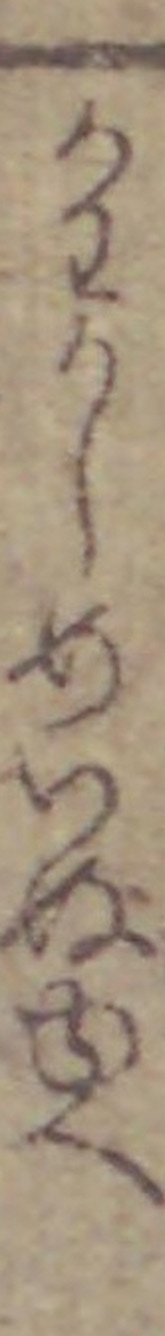かわかしめいぬゆへ
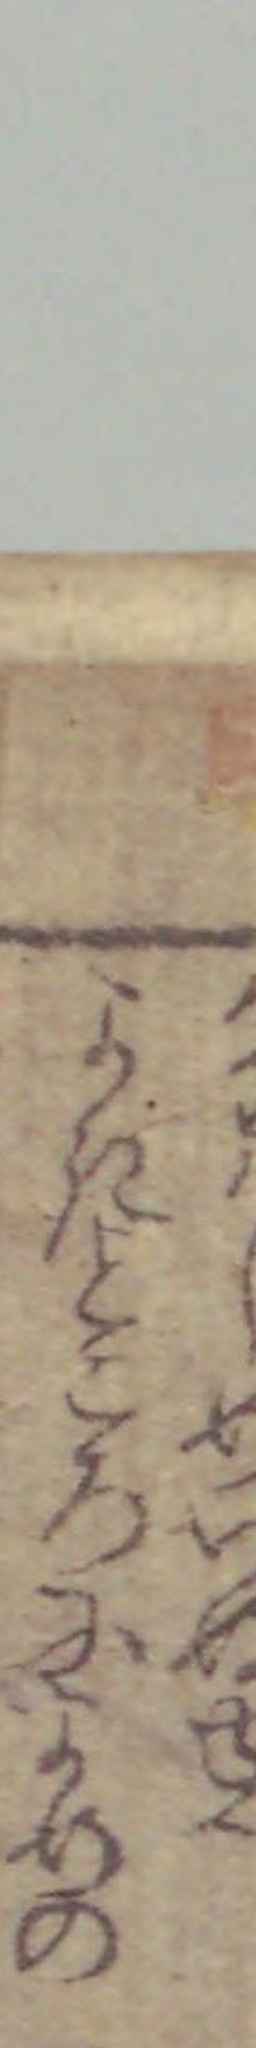よきところによめの
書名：狆の嫁入 2巻
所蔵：国立国会図書館 National Diet Library, JAPAN
